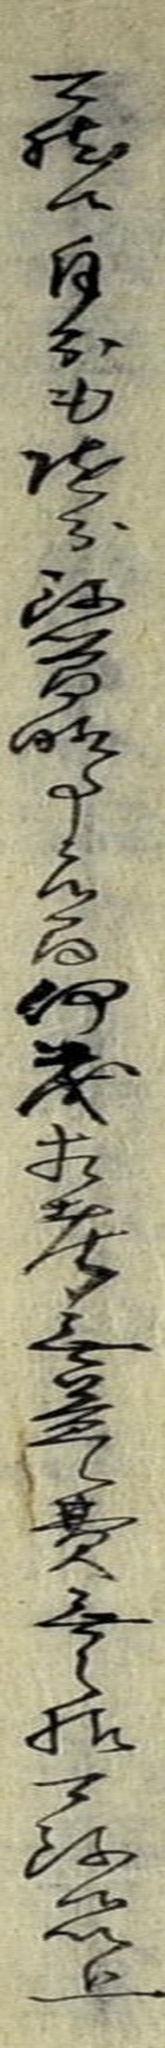可然候自分も随分致簡略事ニ候間何茂相考無益之費無之様可致候以上
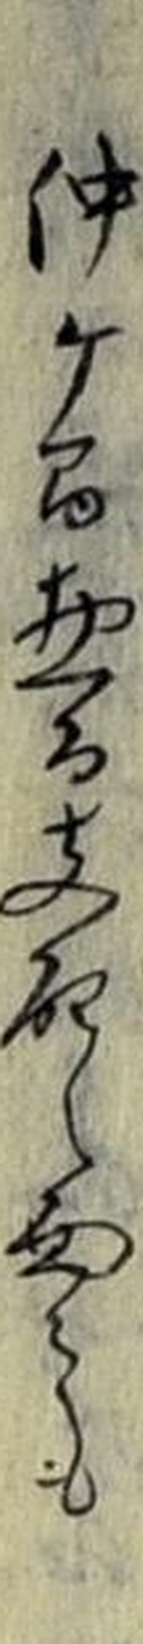仲ケ間惣而支配之面々へも
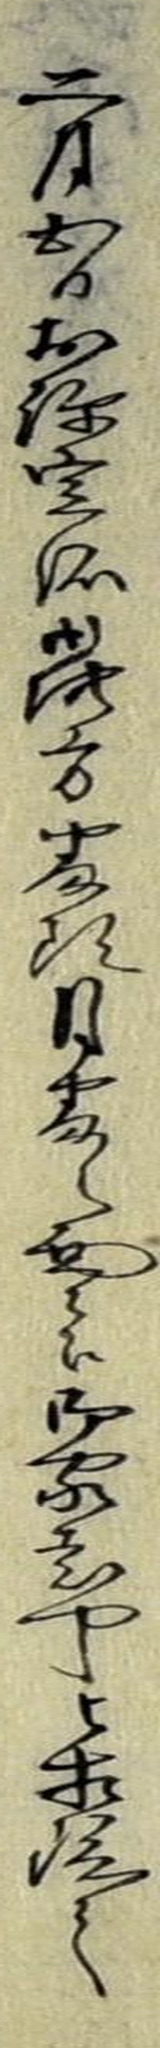二月五日於評定所御供方番頭月番之面々江御家老中被相渡之
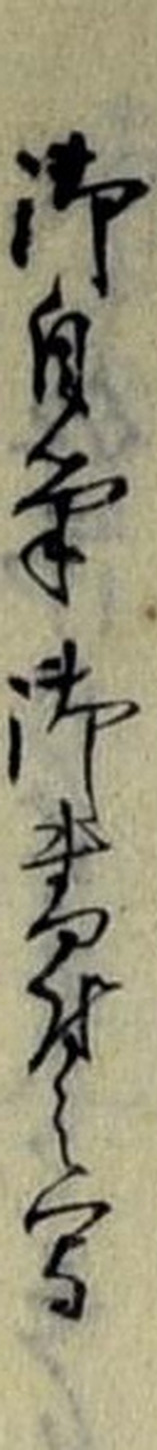御自筆御書付之写
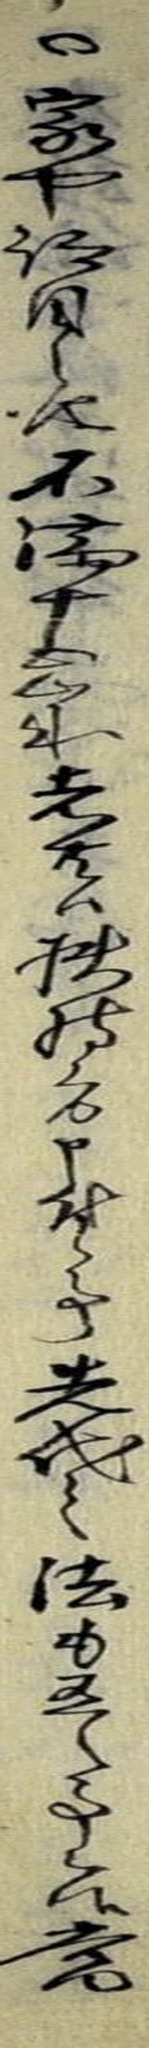〇家中跡目之儀不満十五歳者共ハ扶持方申付候事先代之法も有之事ニ候当
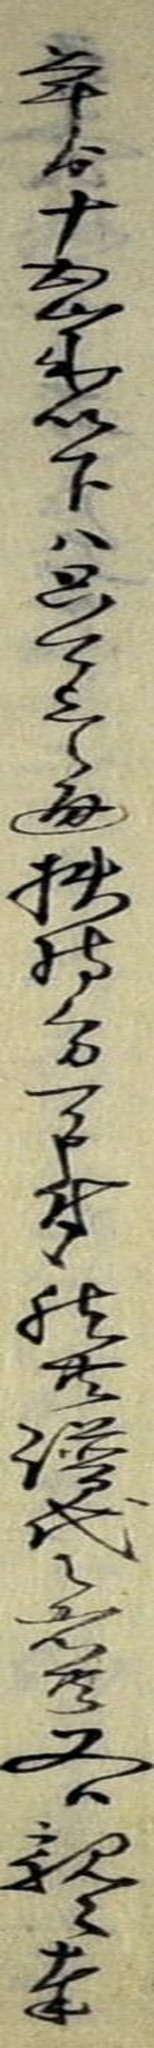年ゟ十五歳以下ハ只今迄之通扶持方可申付候然共譜代之者共又ハ親之奉
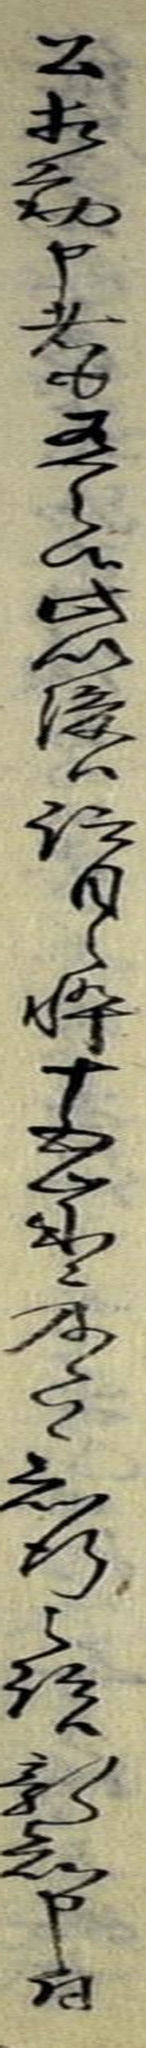公相勤申者も有之候此以後ハ跡目之忰十五歳ニ及候ハヽ知行之跡ハ新知申付
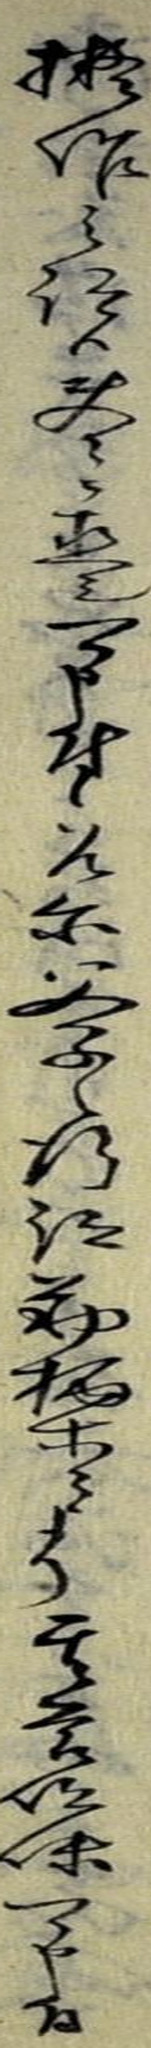擬作之跡ハ夫々ニ直シ可申付候乍尓父子之行跡勤柄等ニより其節吟味可申付
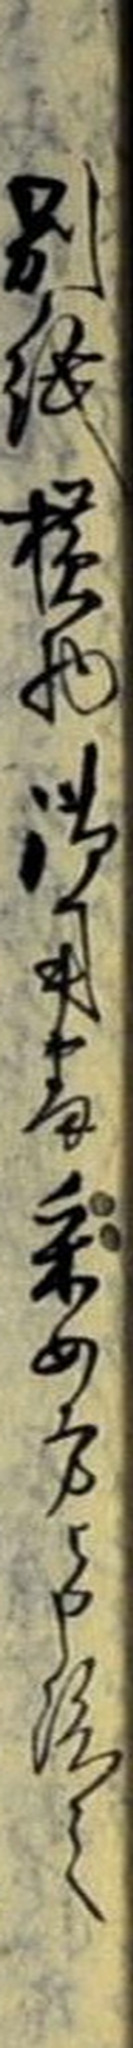別紙横物御用番采女方被申渡之
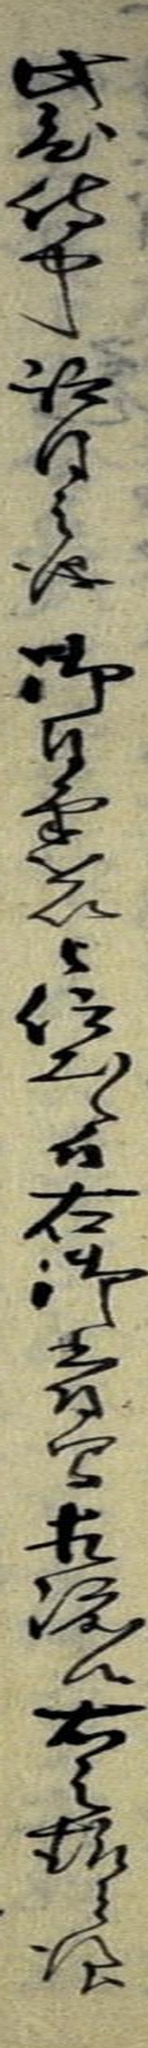此度侍中跡目之儀御自筆を以被仰出候ニ付右御書付写相渡候右之趣ニ候得ハ
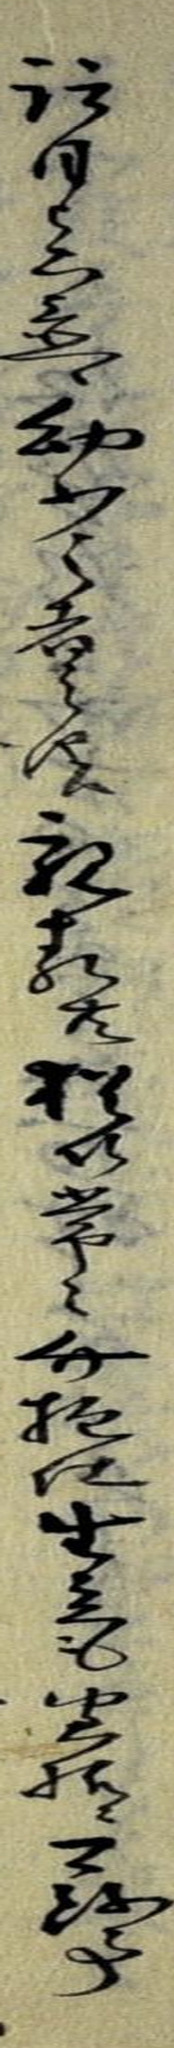跡目被下置候幼少之者之儀ハ親類共猶以常々介抱仕生立も宜様ニ可致事
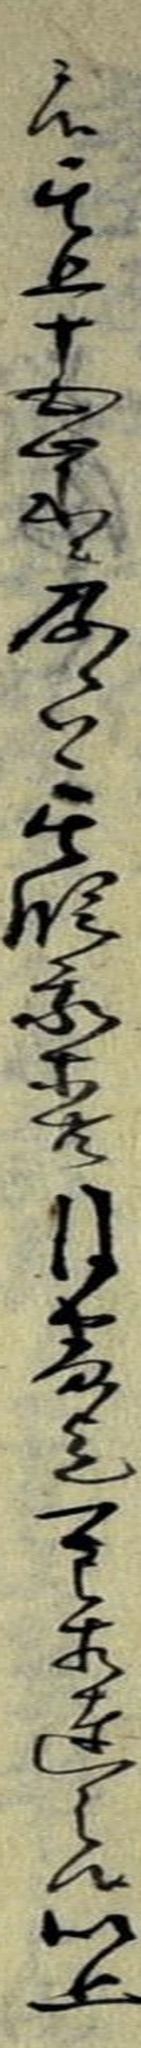ニ候其上十五歳ニ及候ハヽ其段我等共月番迄可被相達之候以上
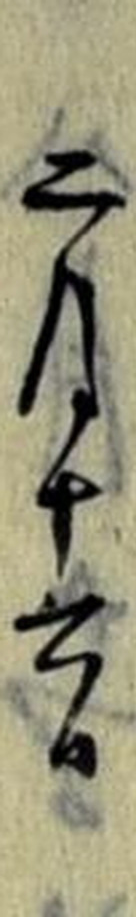二月十六日
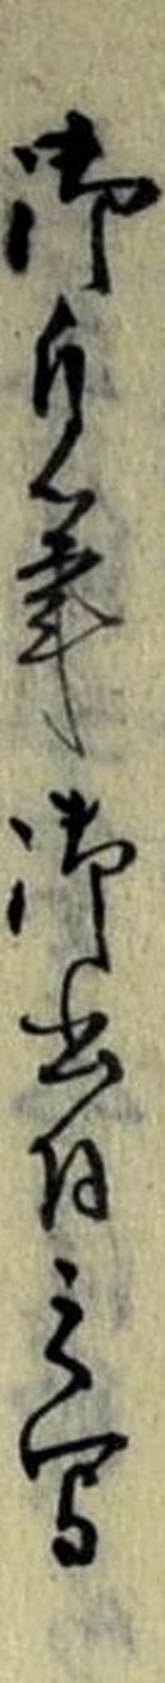御自筆御書付之写
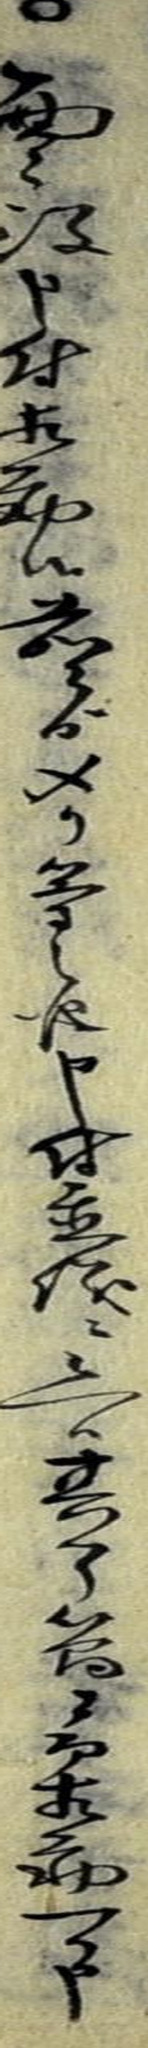〇面々役申付相勤候前々ゟ〆り等之儀申付置儀ニ候ヘハ其了簡ニ而相勤可申
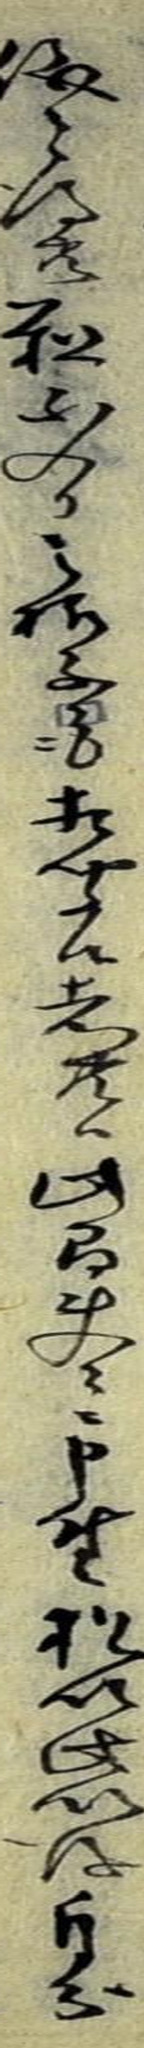儀ニ候得共粗不〆り之様子ニも相聞候者共ハ此間夫々ニ申付候猶以此以後自分
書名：命令之部 一
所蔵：福井県文書館 Fukui Prefectural Archives
